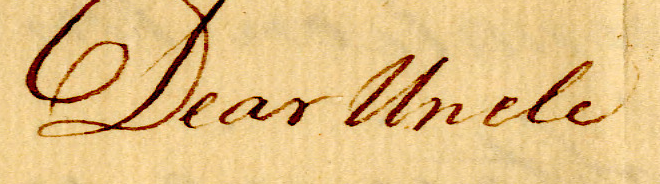Dear Uncle
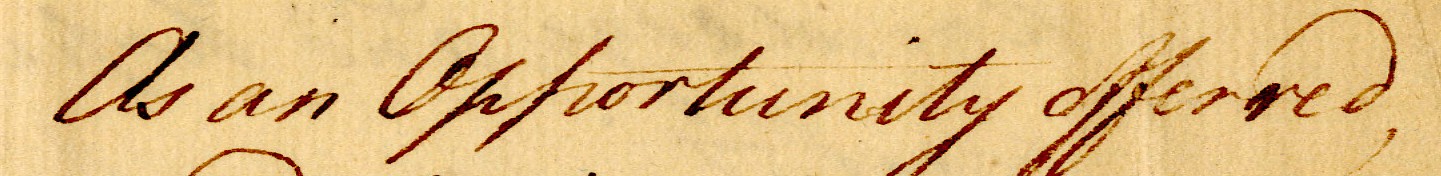As an Opportunity offered,
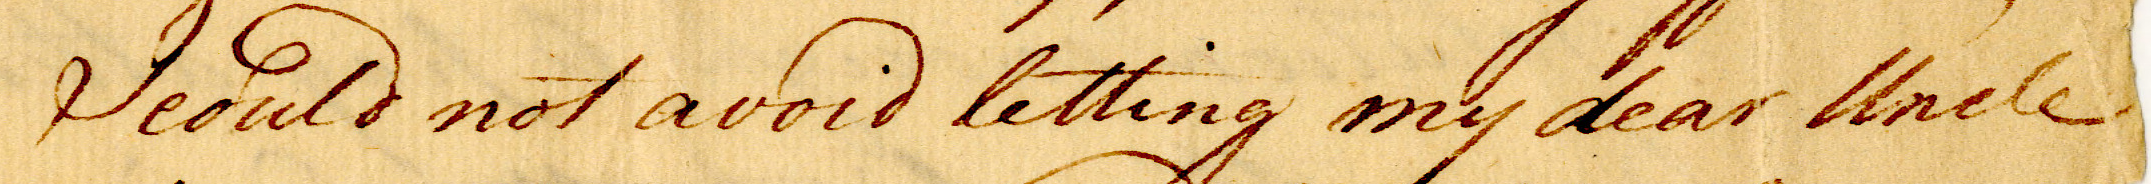I could not avoid letting my dear Uncle
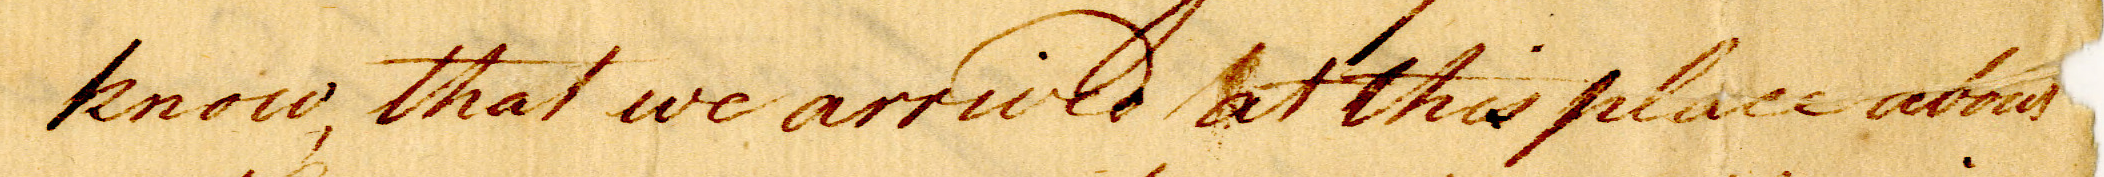know, that we arrived at this place about
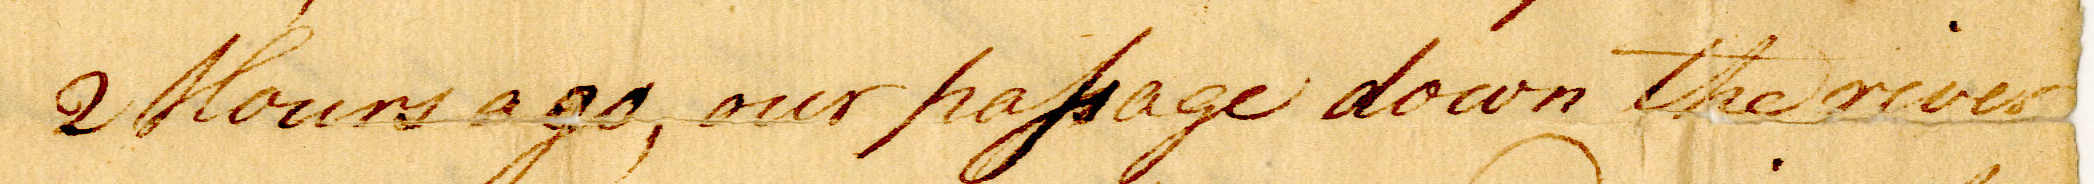2 Hours ago, our passage down the river
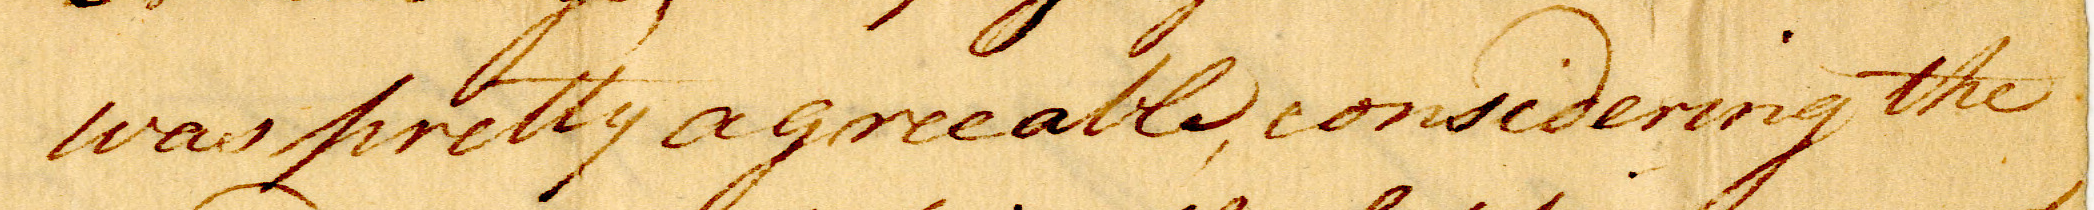was pretty agreeable, considering the
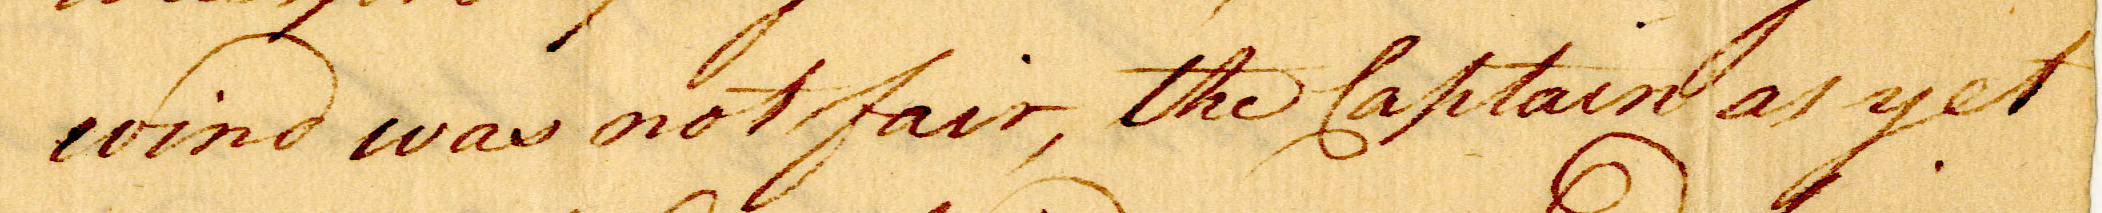wind was not fair, the Captain as yet
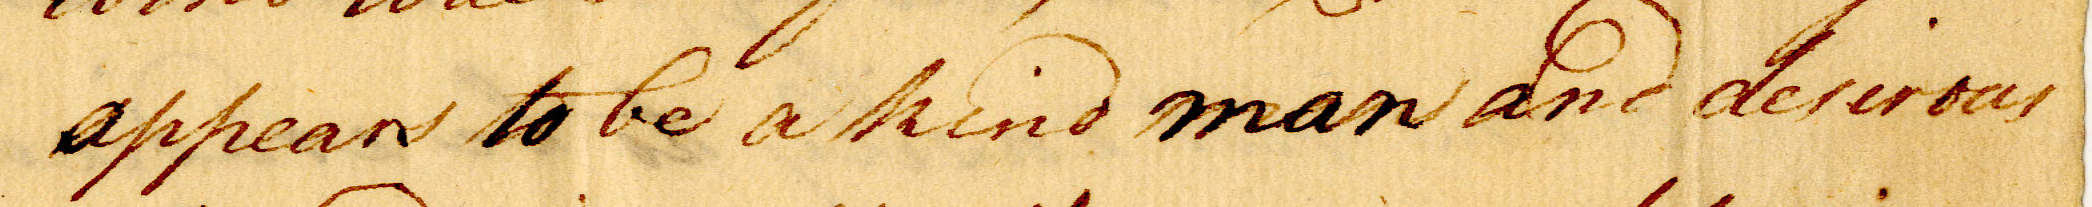appears to be a kind man and desirous
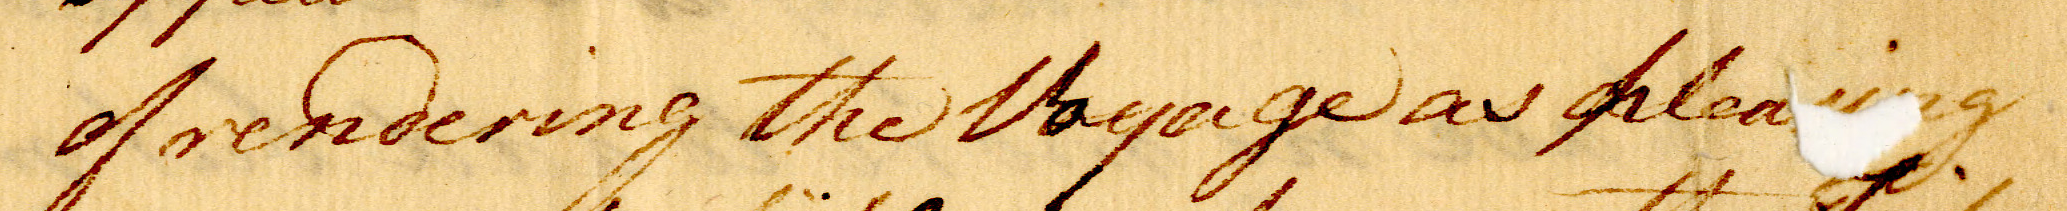of rendering the Voyage as pleasing
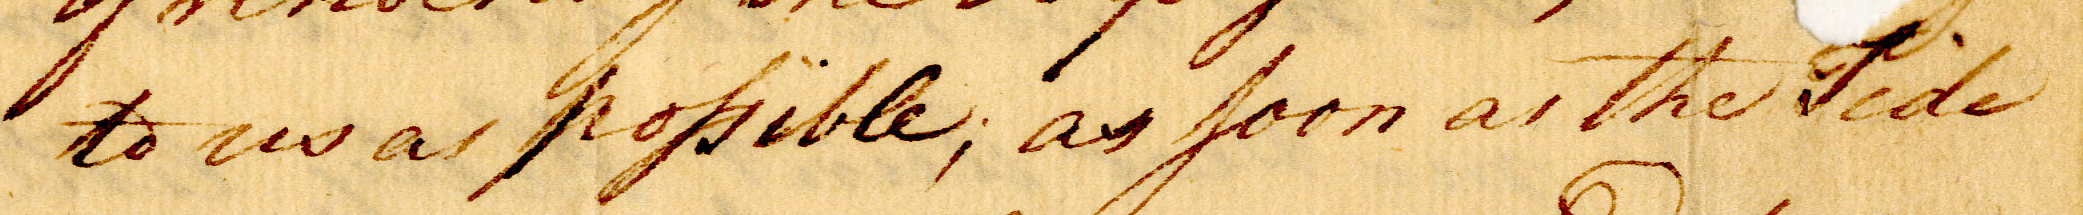to us as possible, as soon as the Tide
